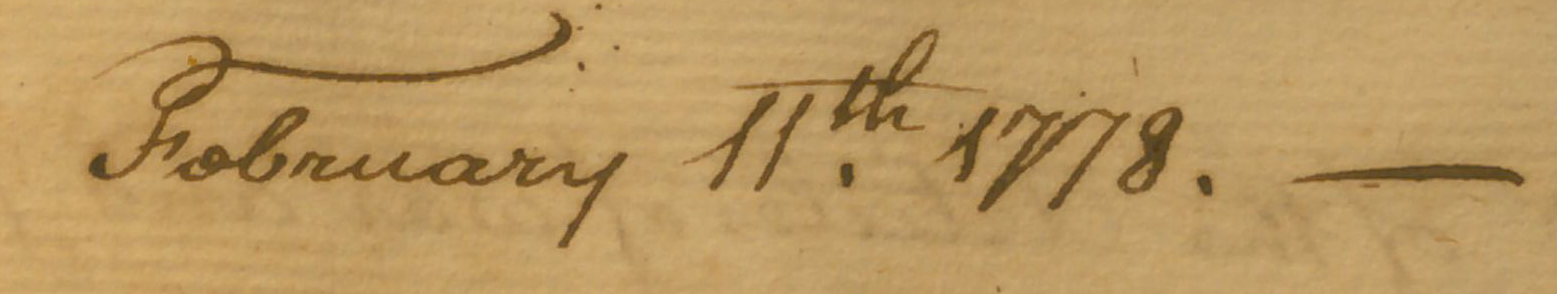February 11^th. 1778.-
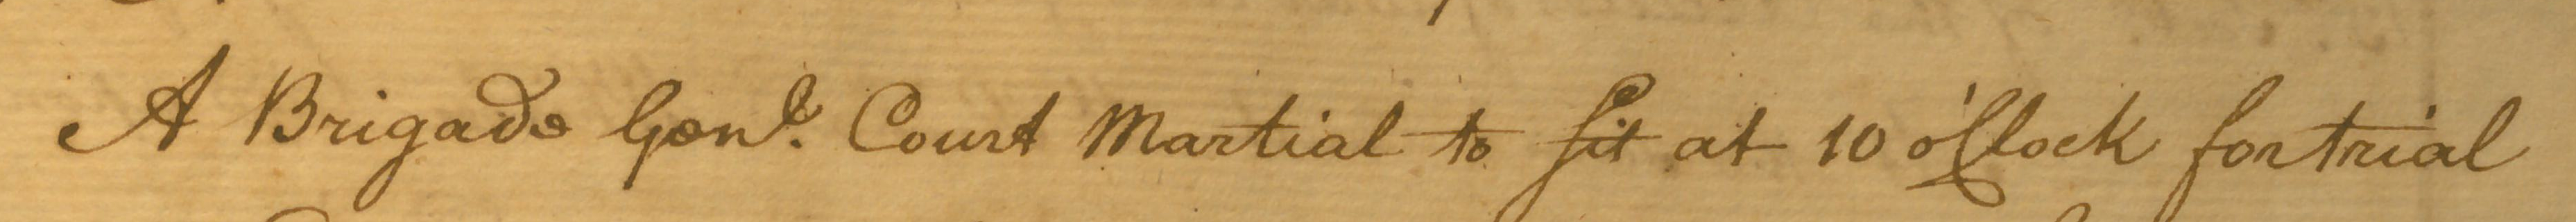A Brigade Gen^l. Court Martial to sit at 10 o'Clock for trial
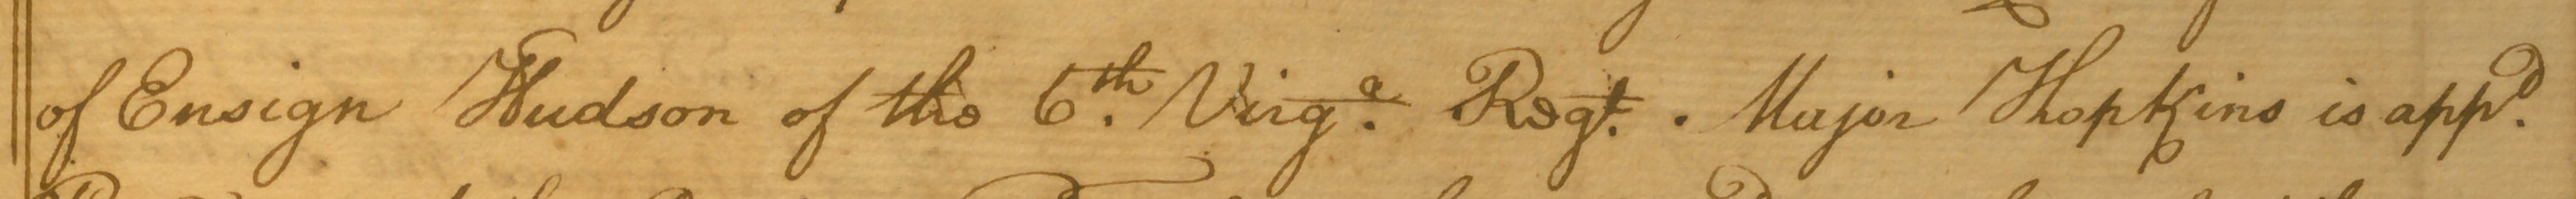of Ensign Hudson of the 6^th. Virg^a. Reg^t. Major Hopkins is app^d.
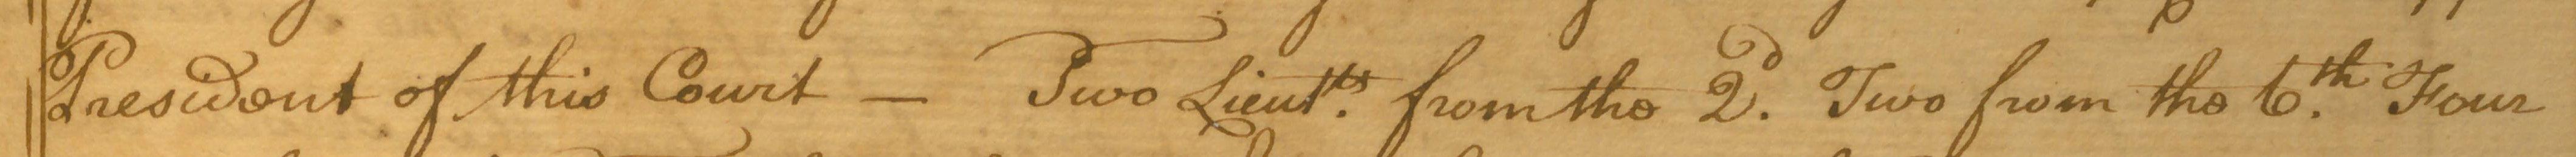President of this Court- Two Lieut^ts. from the 2^d. Two from the 6^th. Four
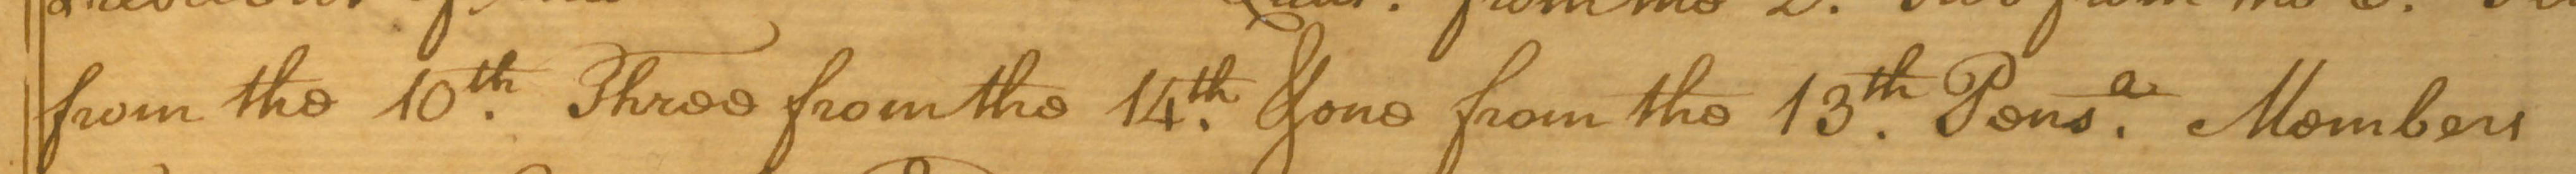from the 10^th. Three from the 14^th. & one from the 13^th. Pens^a. Members
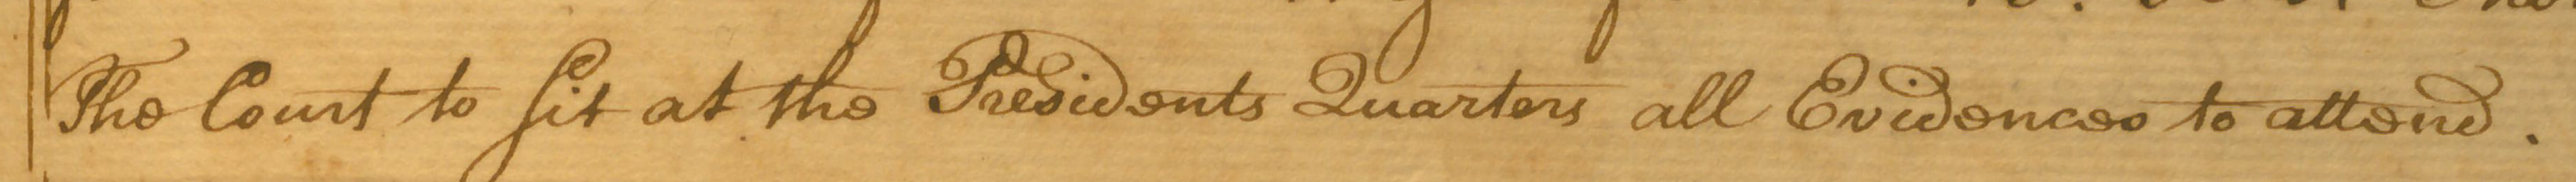The Court to sit at the Presidents Quarters all Evidence to attend.
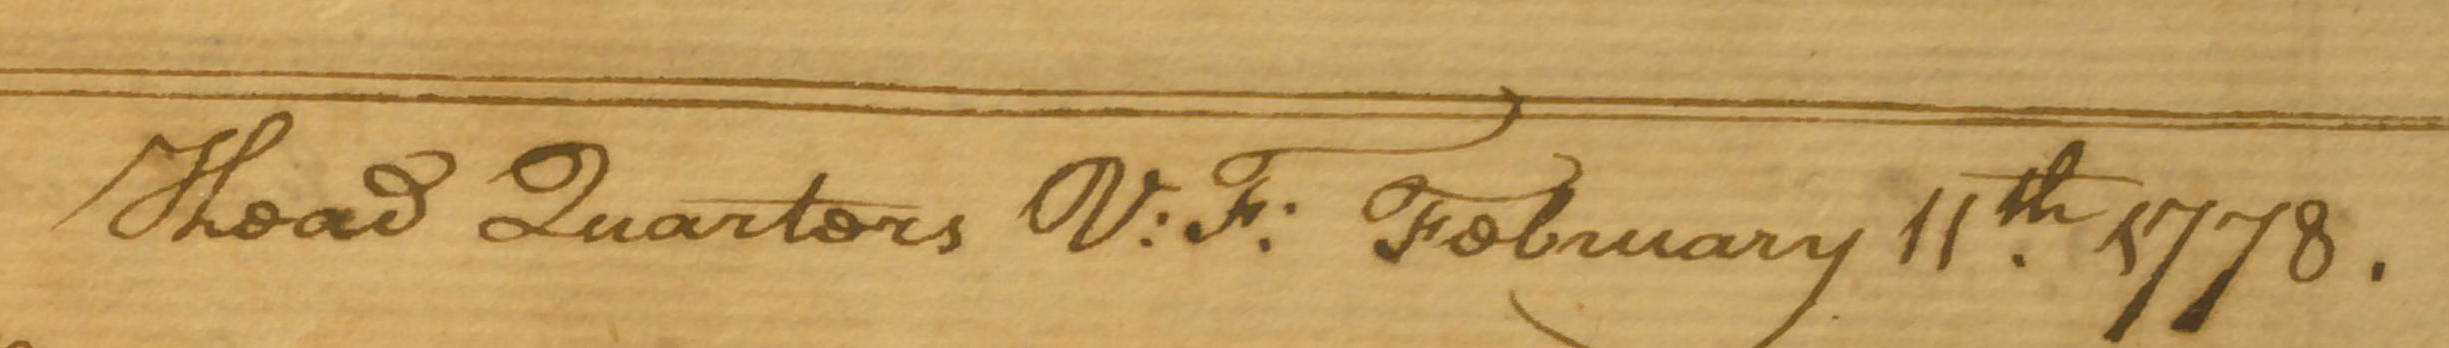Head Quarters V: F: February 11^th. 1778.
